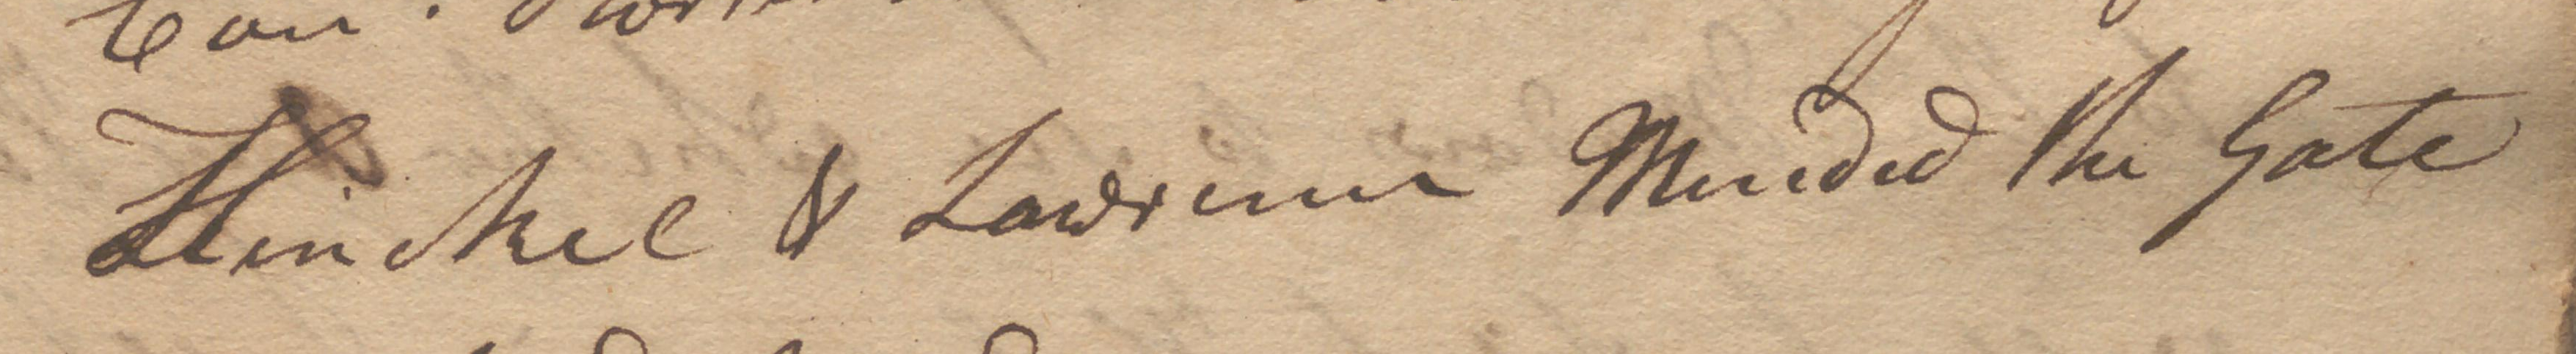Hinckel & Lawrence mended the Gate
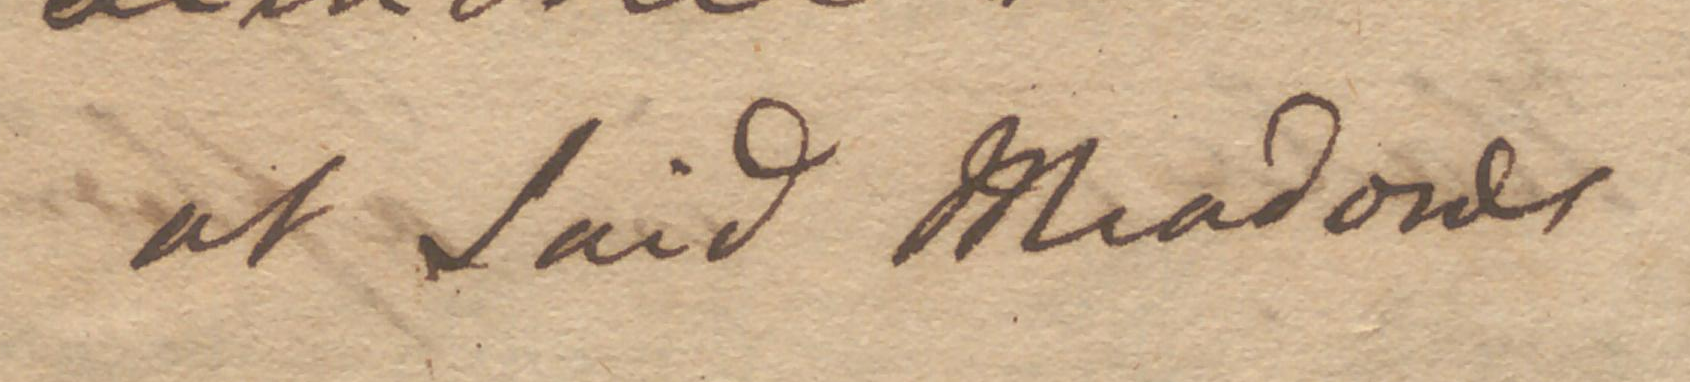at said Meadows
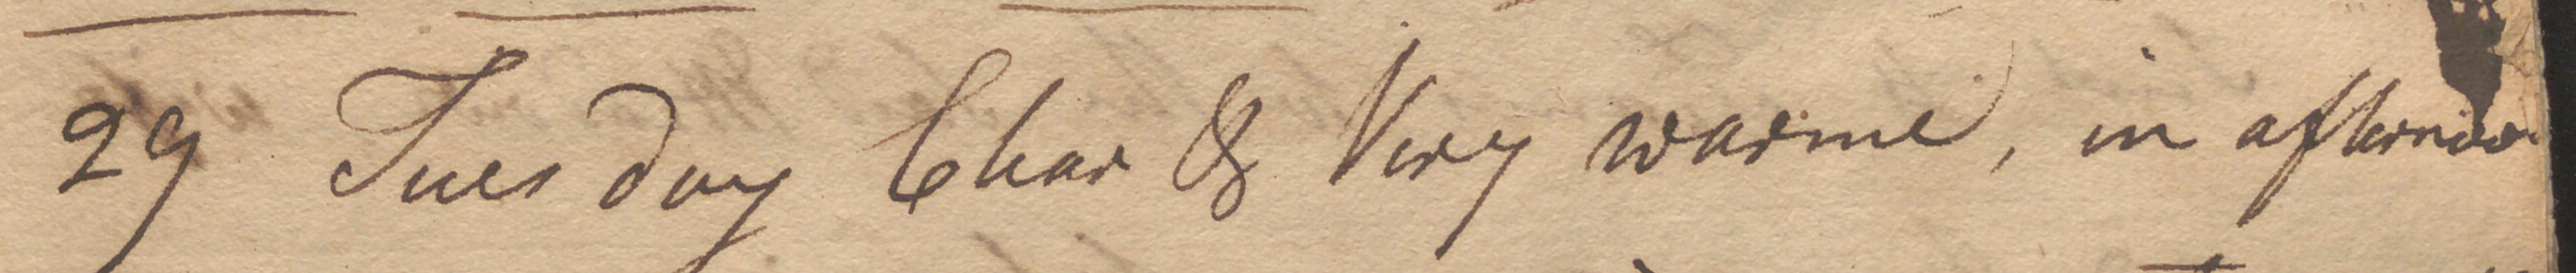29 Tuesday Clear & Veny warme, in afternoon
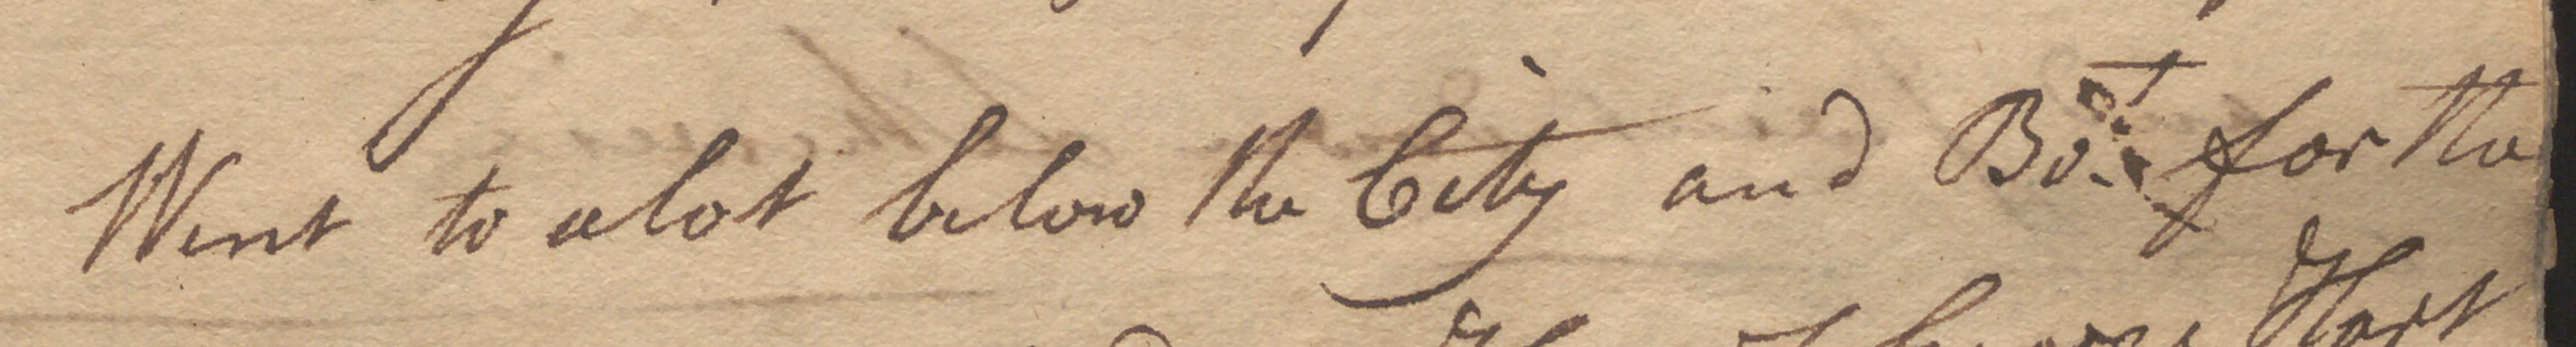Went to a lot below the City and Bo^t. for the
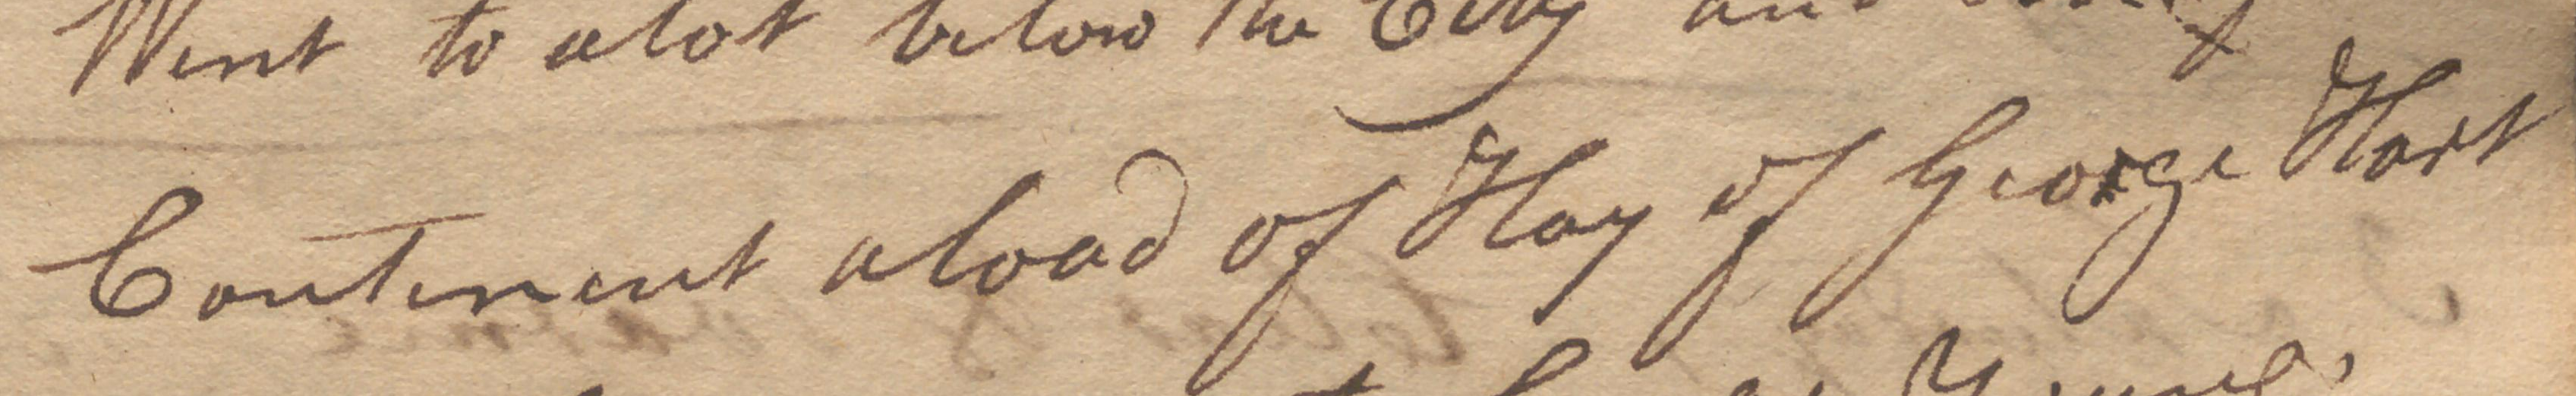Continent a load of Hay of George Hart
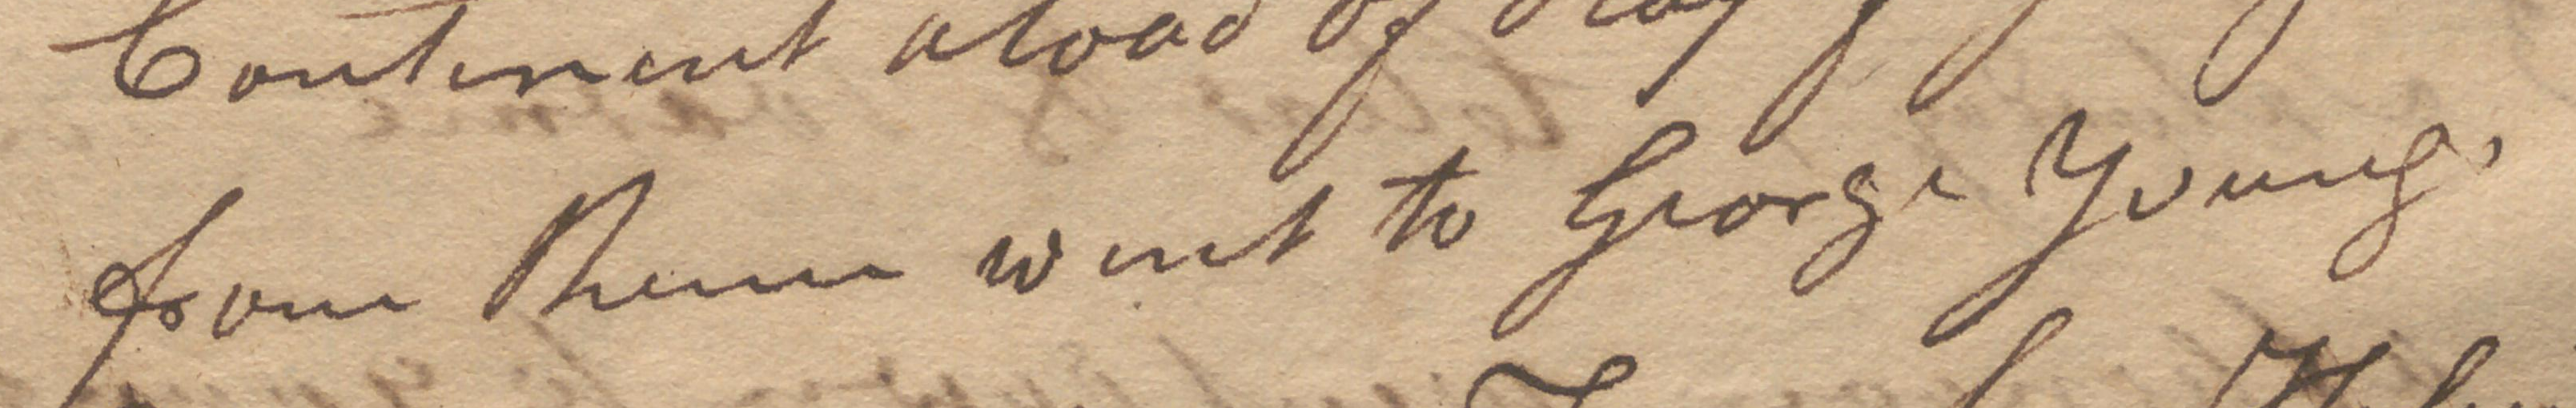fron thence went to George Youngs
